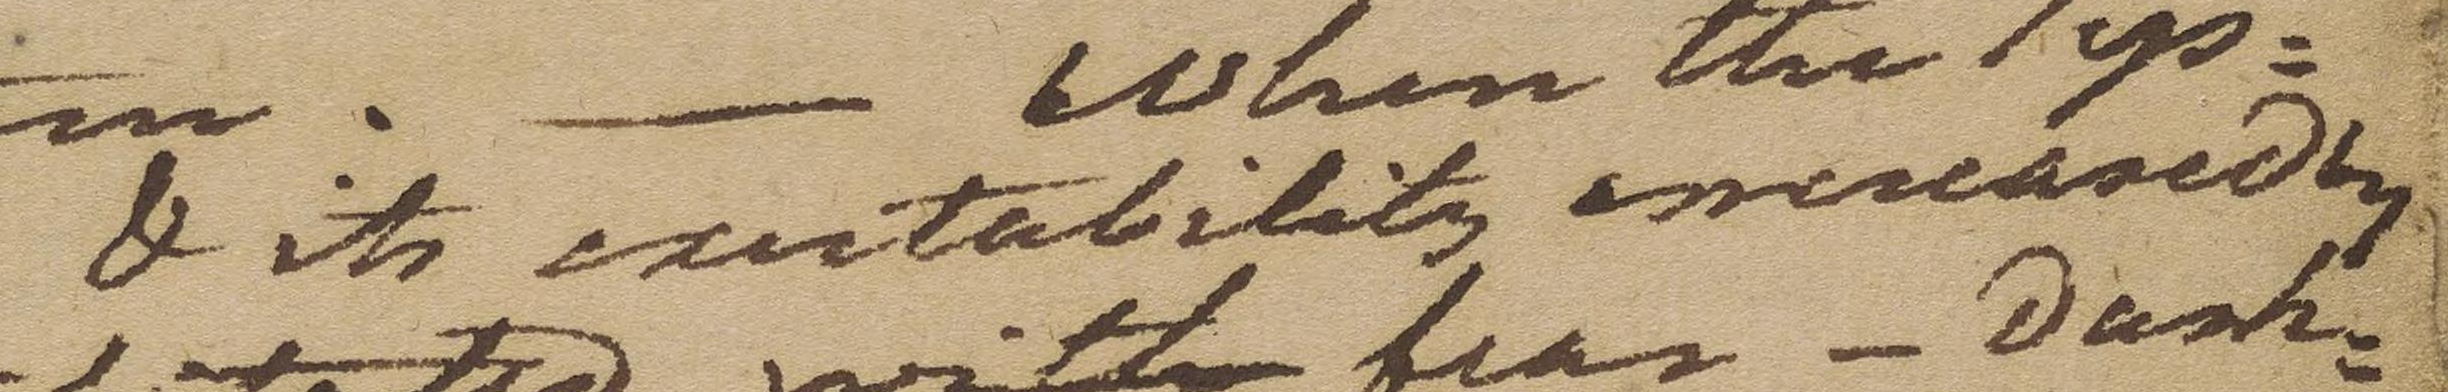& its excitability encreased by
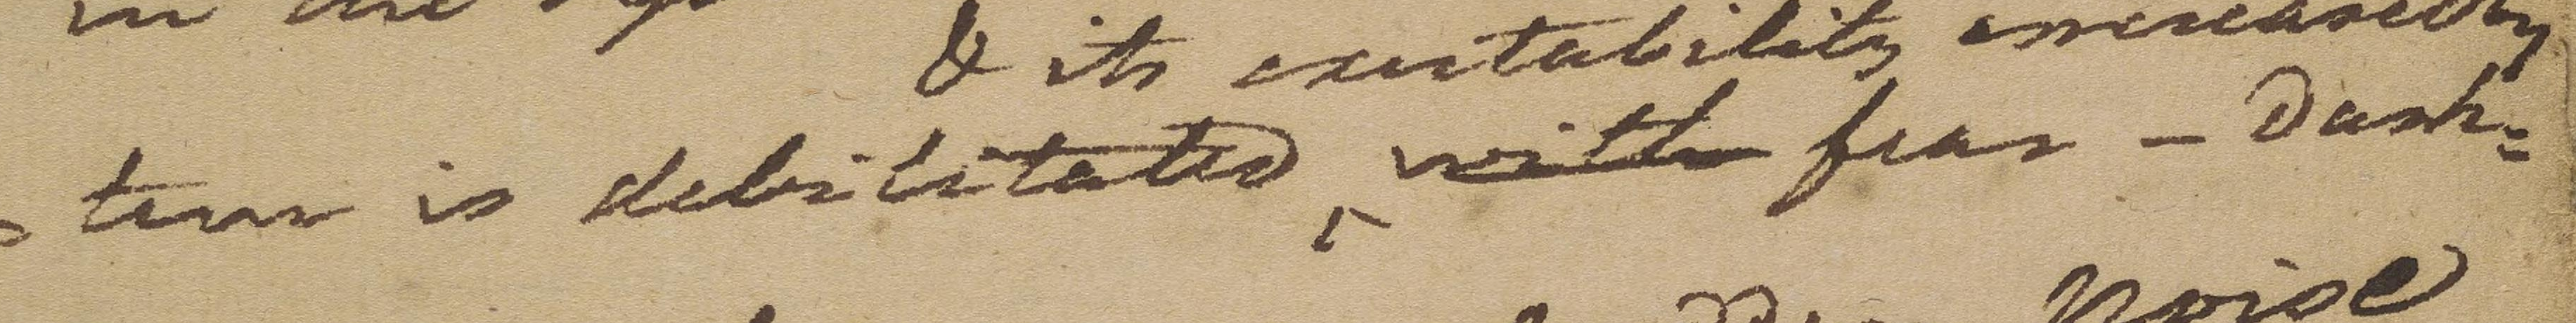-them is debilitated ^ [with] fear, dark-
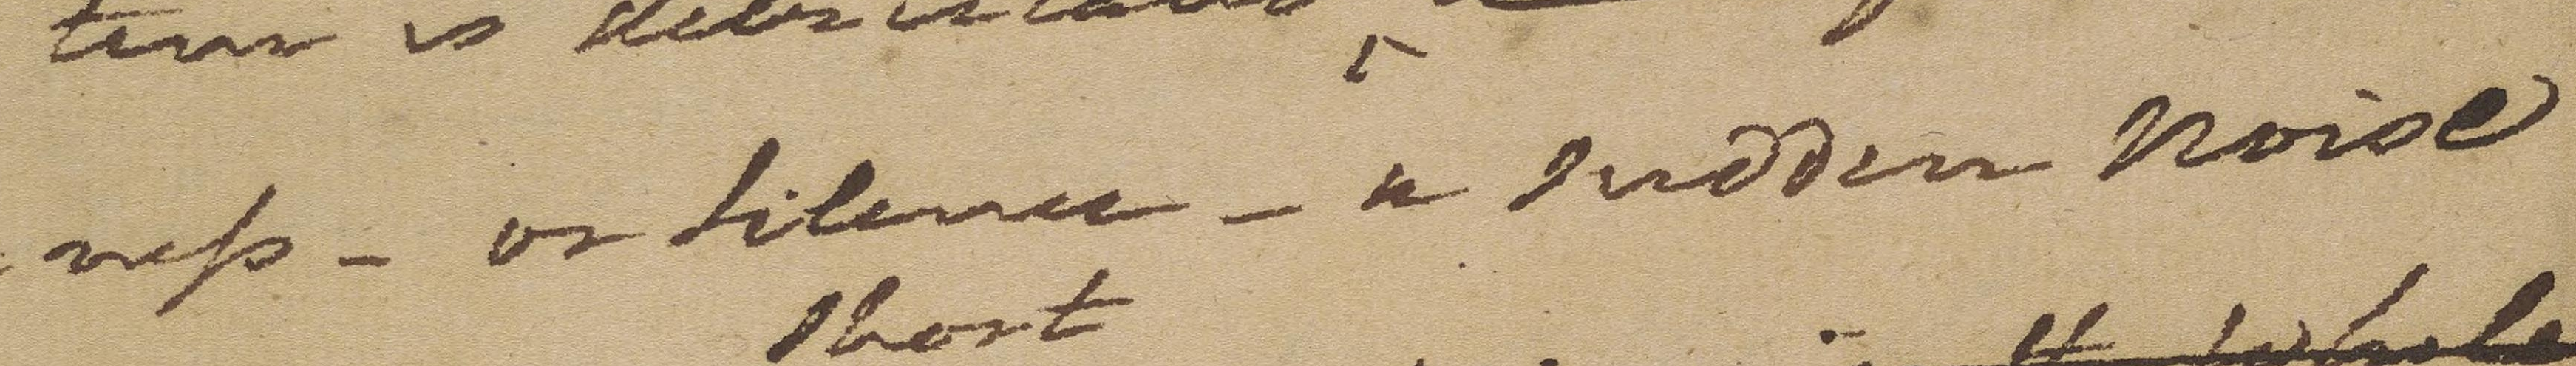-ness, or silence. A sudden noise
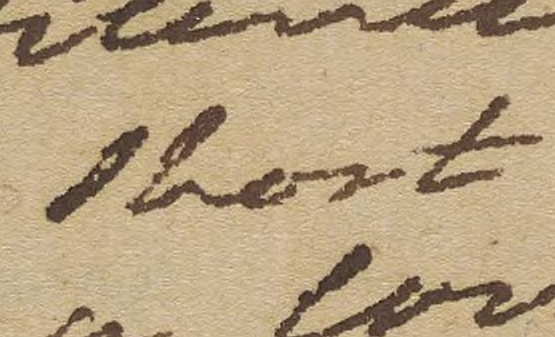short
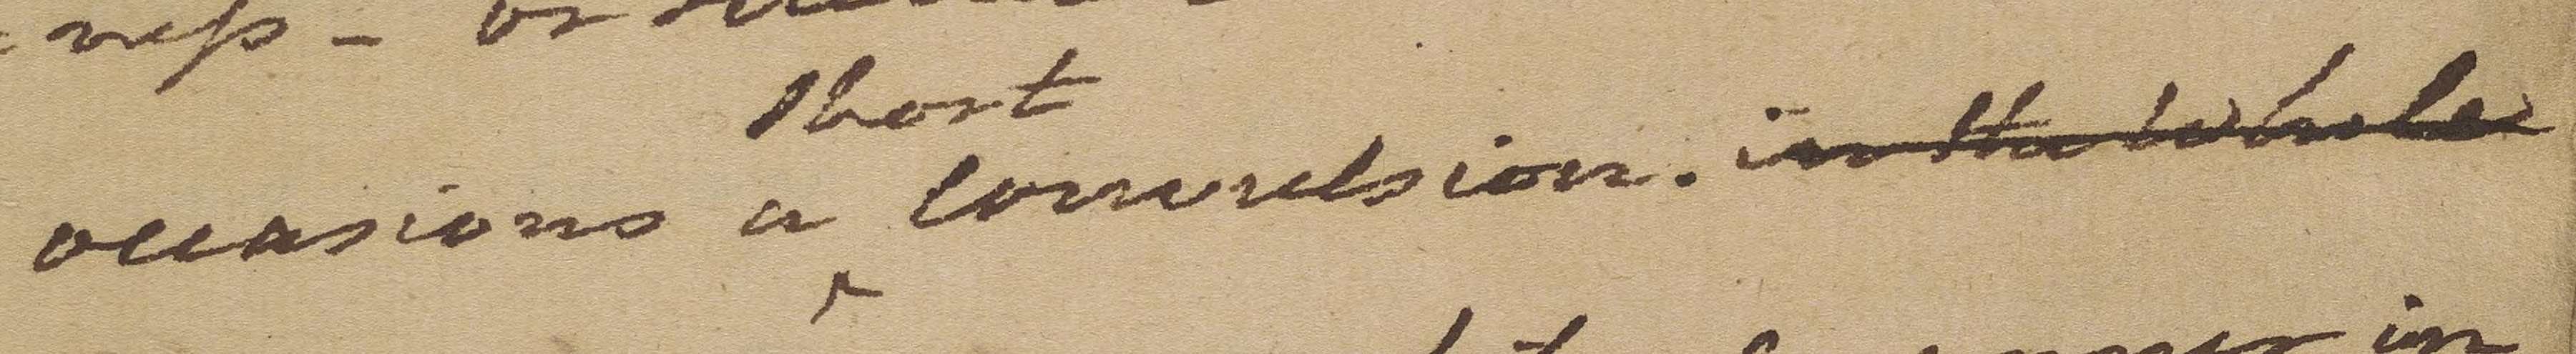occasions a ^ convulsion. [in the whole]
